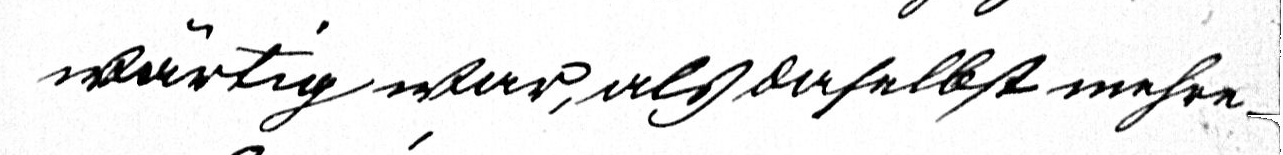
wärtig war, als daselbst mehre¬
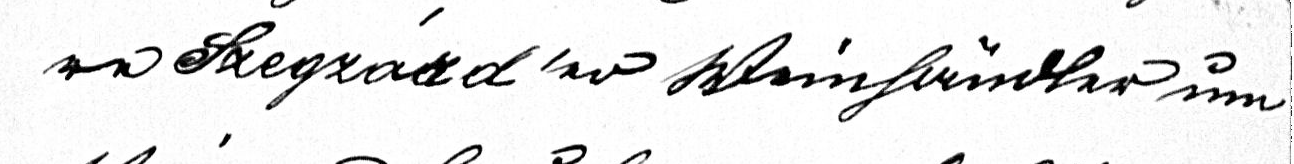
re Szegzárd'er Weinhändler um
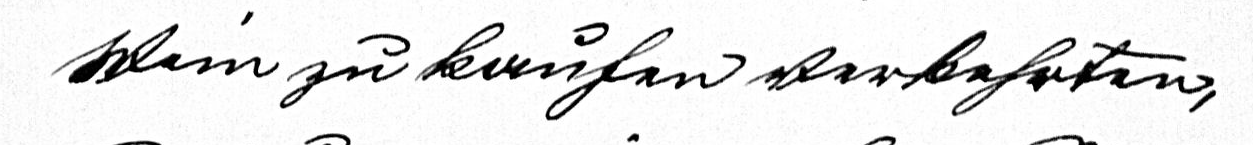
Wein zu kaufen verkehrten,
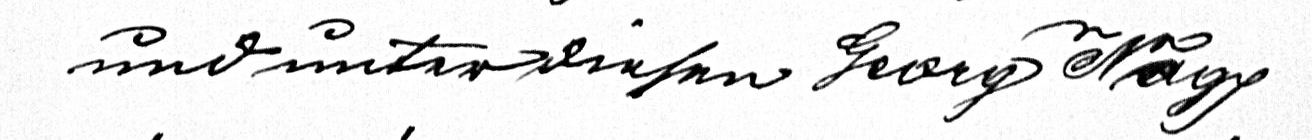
und unter diesen Georg Nagy
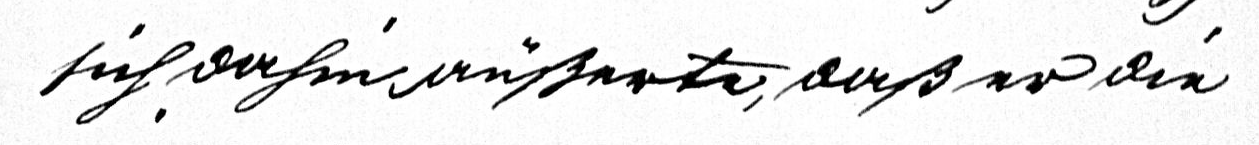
sich dahin äußerte, das er die
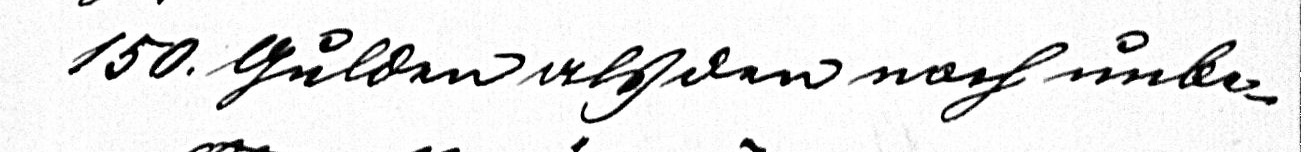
150. Gulden als den noch unbe¬
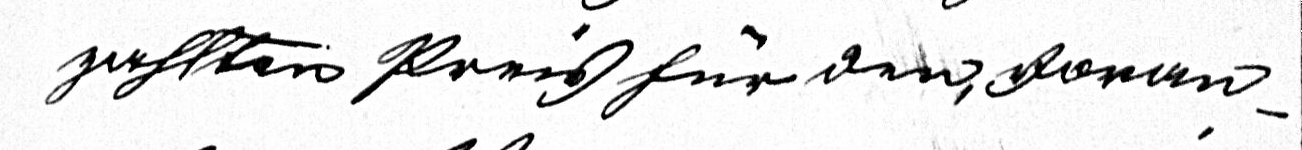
zahlten Preis für den, voran¬
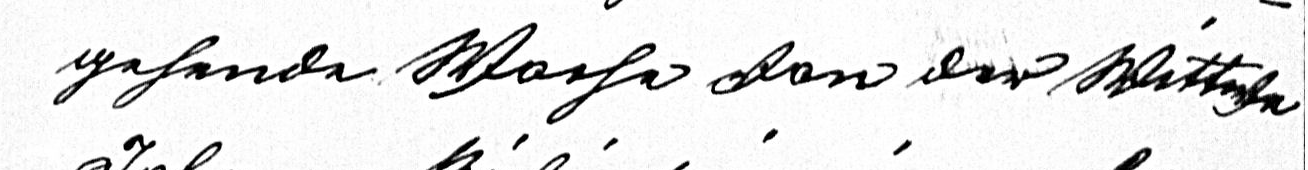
gehende Woche von der Wittwe
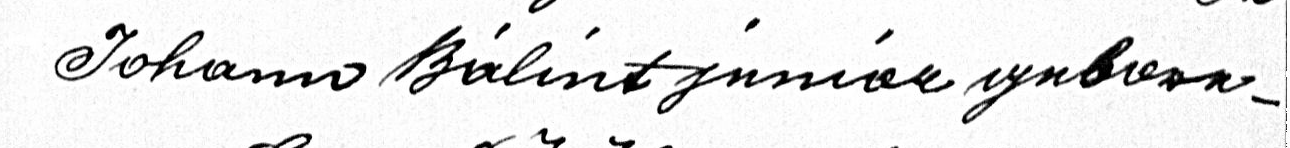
Johann Bálint junior gebore¬
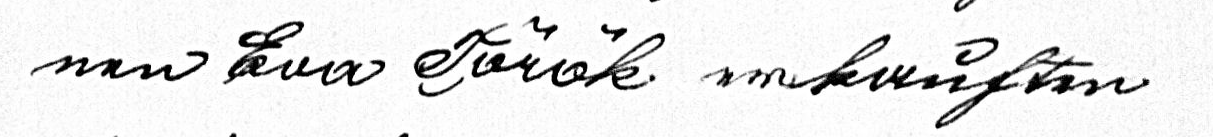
nen Eva Török erkauften
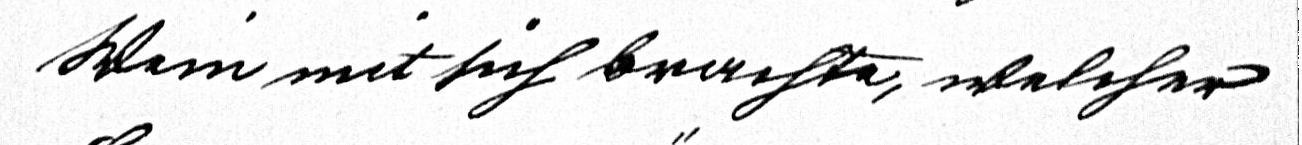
Wein mit sich brachte, welcher
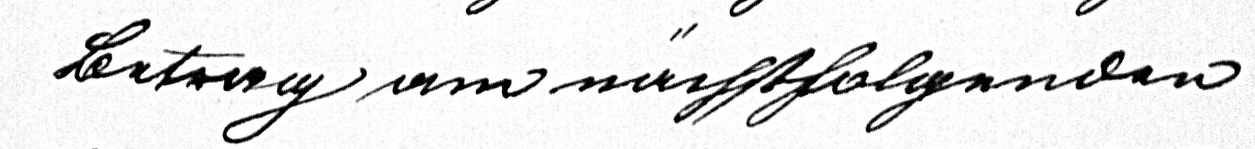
Betrag am nächstfolgenden
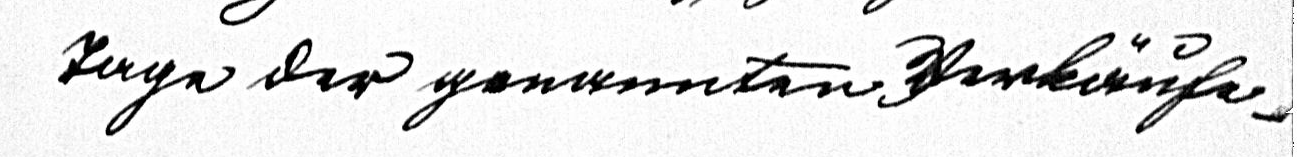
Tage der genannten Verkäufe¬
